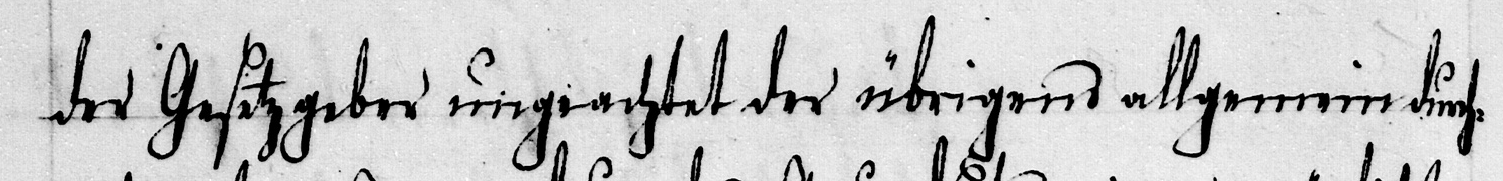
der Gesetzgeber ungeachtet der übrigens allgemein durc¬
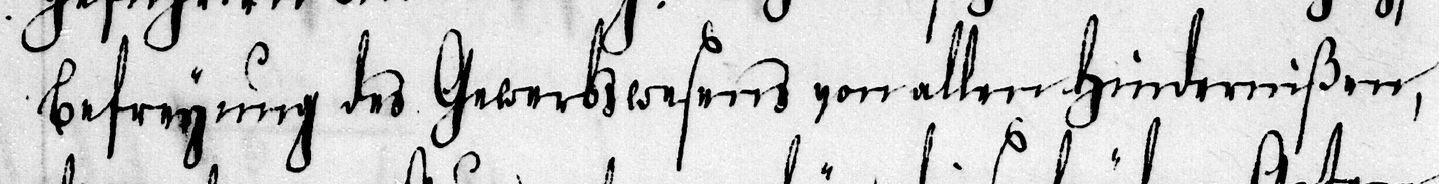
Befreyung des Gewerbswesens von allen Hindernißen,
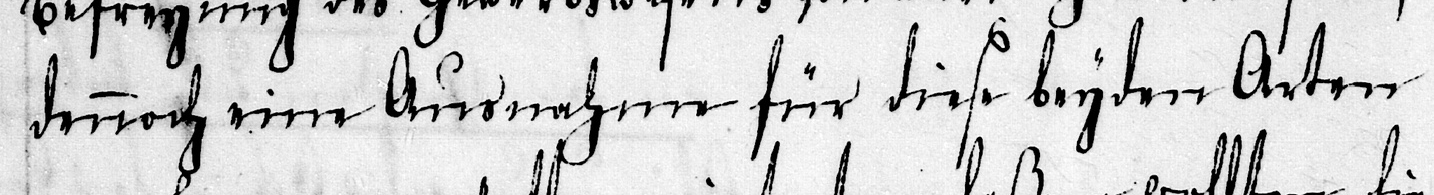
dennoch eine Ausnahme für diese beyden Arten
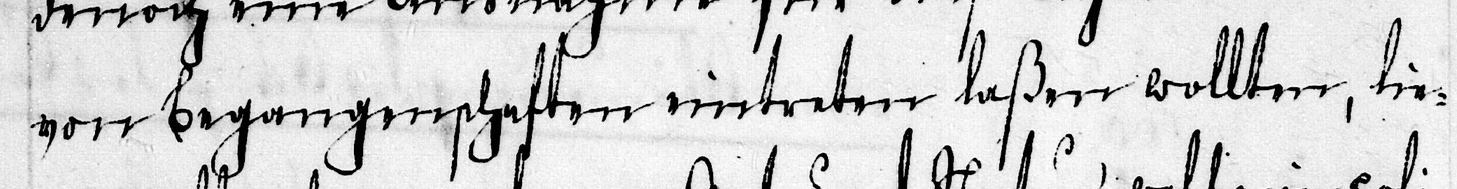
von Begangenschaften eintreten laßen wollten, lie¬
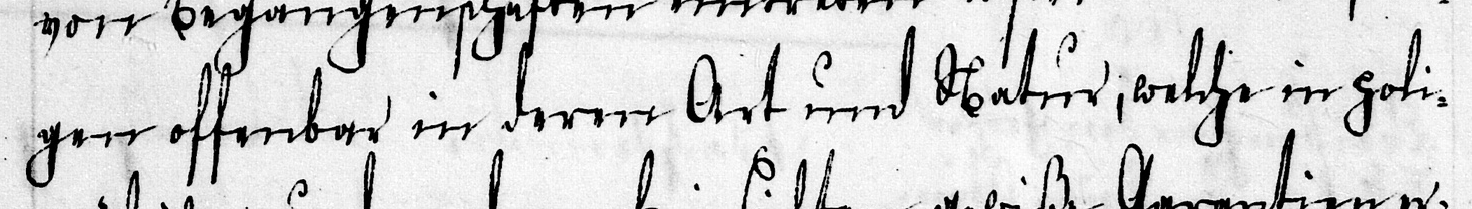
gen offenbar in deren Art und Natur, welche in poli¬
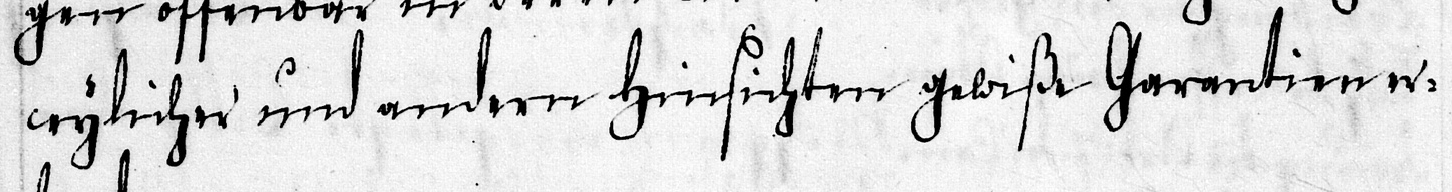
ceylicher und andern Hinsichten gewiße Garantien er¬
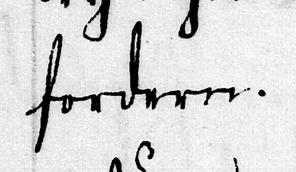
fordern.
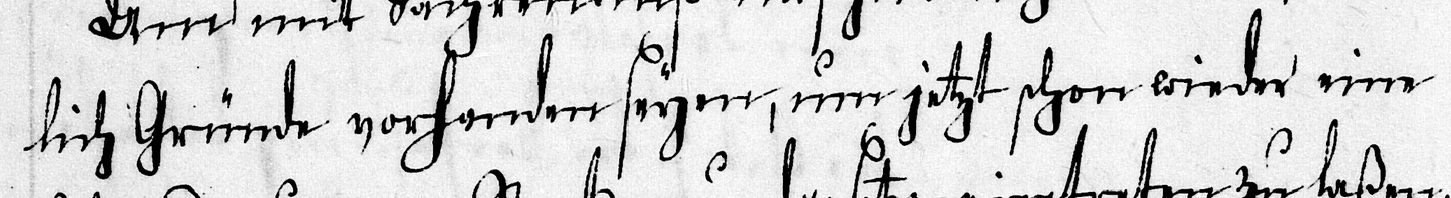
lich Gründe vorhanden seyen, um jetzt schon wieder eine
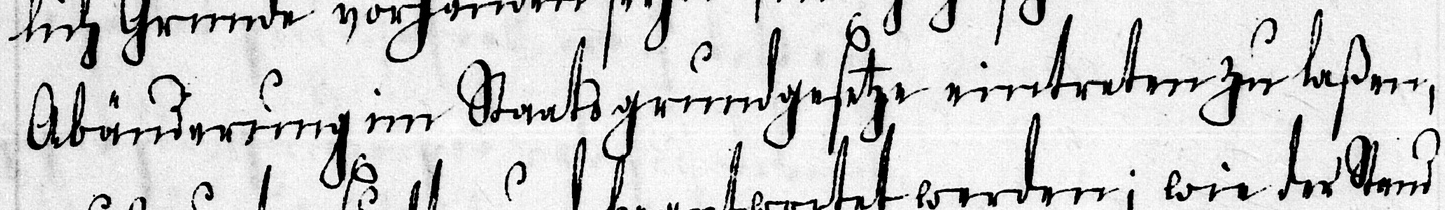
Abänderung im Staatsgrundgesetze eintreten zu laßen,
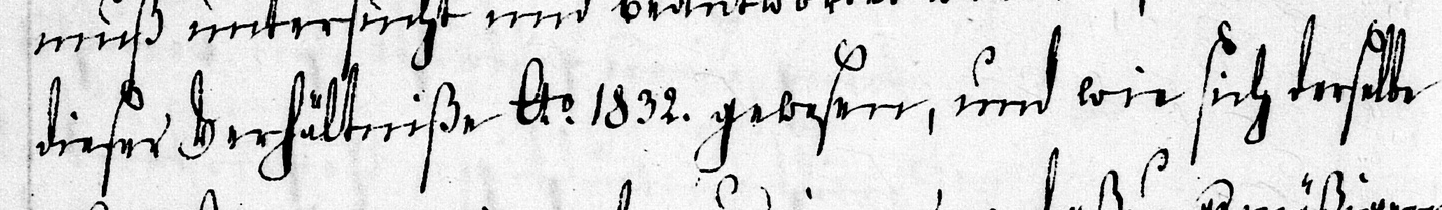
dieser Verhältniße Ao. 1832. gewesen, und wie sich derselbe
